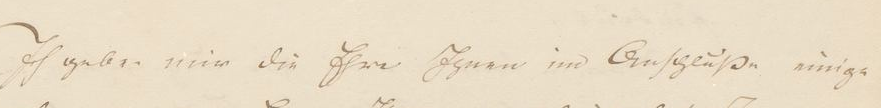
Ich gebe mir die Ehre Ihnen im Anschluße einige
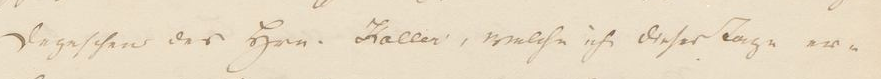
Depeschen des Hrn. Koller, welche ich dieser Tage er-
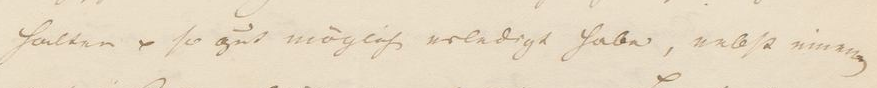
halten & so gut möglich erledigt habe, nebst einem
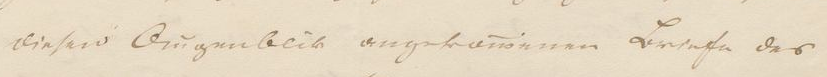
diesen Augenblik angekommenen Briefe des
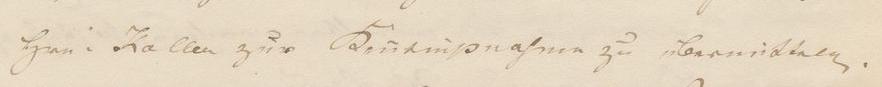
Hrn. Koller zur Kenntnißnahme zu übermitteln.
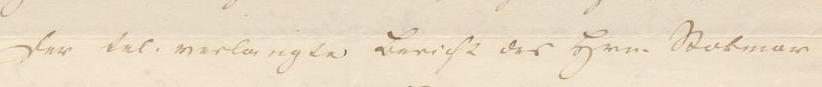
Der tel. verlangte Bericht des Hrn. Stokmar
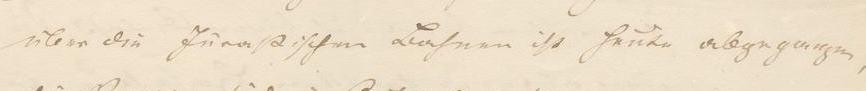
über die Juraßischen Bahnen ist heute abgegangen,
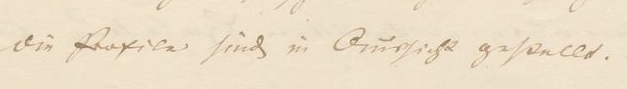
die Profile sind in Aussicht gestellt. –
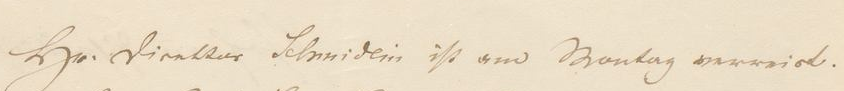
Hr.Direktor Schmidlin ist am Montagverreist.
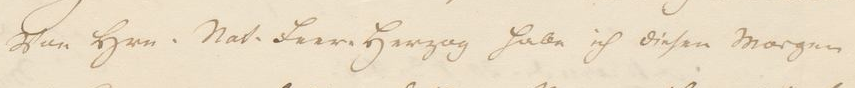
Von Hrn. Nat. Feer-Herzog habe ich diesen Morgen
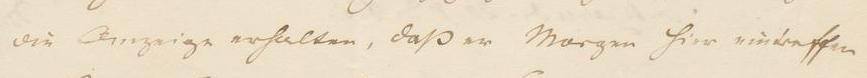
die Anzeige erhalten, daß er Morgen hier eintreffen
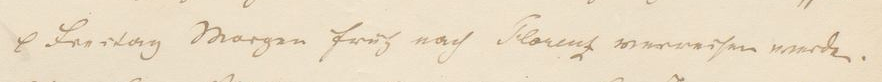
& Freitag Morgen früh nach Florenz verreisen werde.
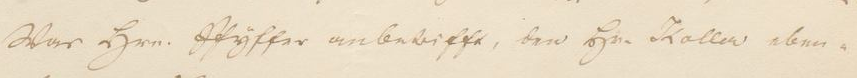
Was Hrn. Pfyffer anbetrifft, den Hr. Koller eben-
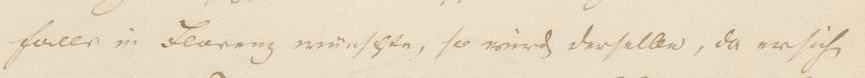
falls in Florenz wünschte, so wird derselbe, da er sich
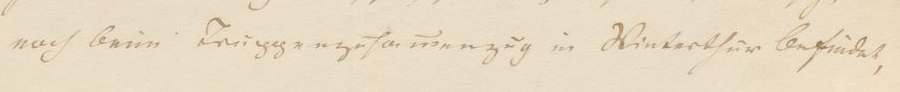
noch beim Truppenzusammenzug in Winterhur befindet,
